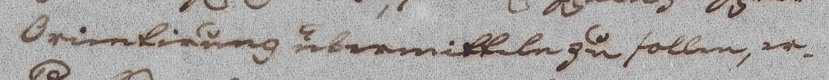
Orientirung übermitteln zu sollen, er-
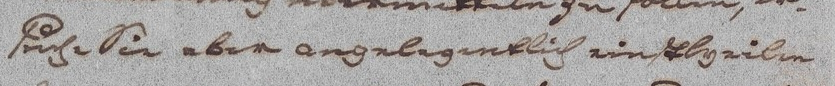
suche Sie aber angelegentlich einstweilen
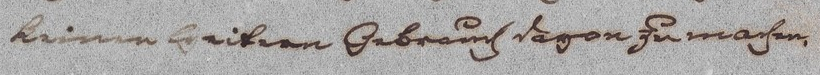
keinen weitern Gebrauch davon zu machen.
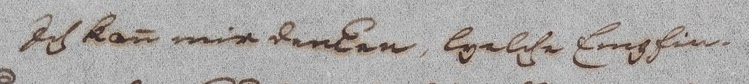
Ich kann mir denken, welche Empfin-
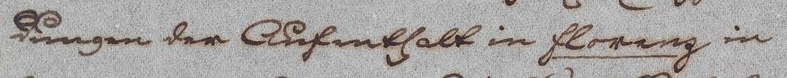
dungen der Aufenthalt in Florenz in
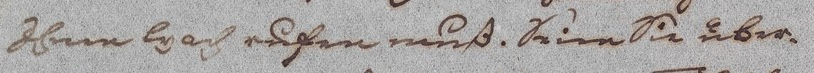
Ihnen wach rufen muss. Seien Sie über-
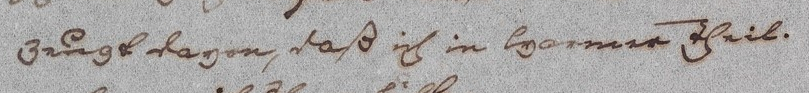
zeugt davon, daß ich in warmer Theil-
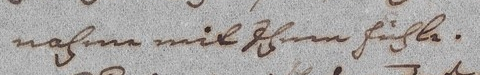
nahme mit Ihnen fühle.
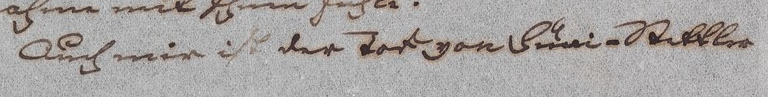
Auch mir ist der Tod von Hüni-Stettler
